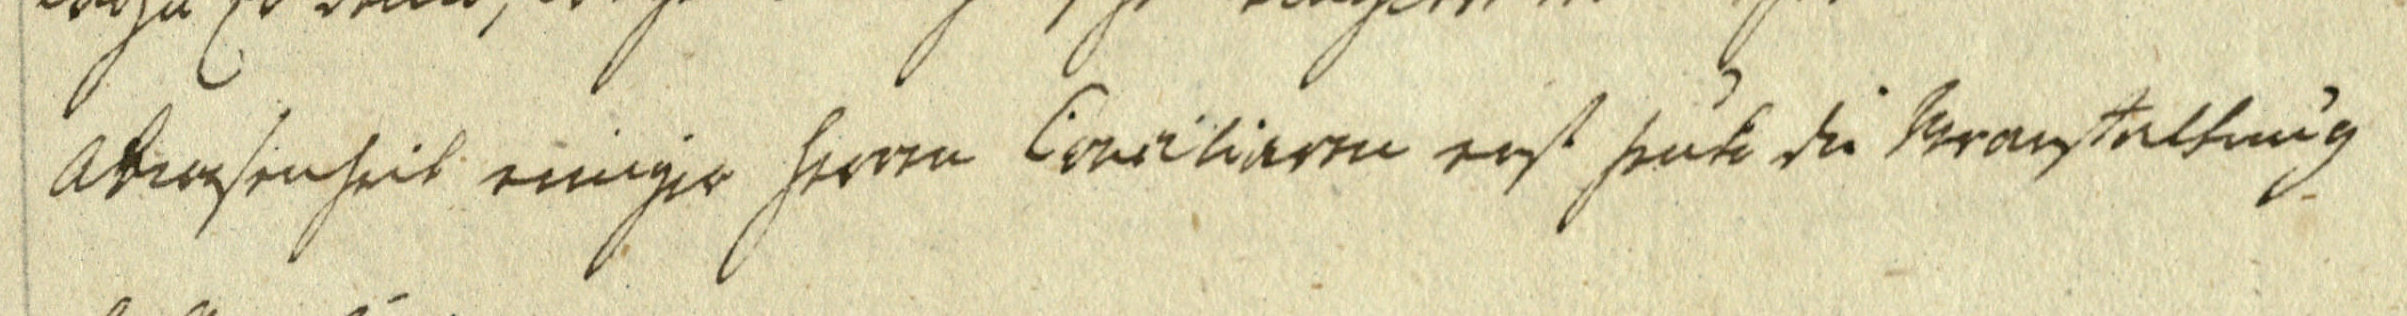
Abwesenheit einiger Herren Conciliaren erst heute die Veranstaltung
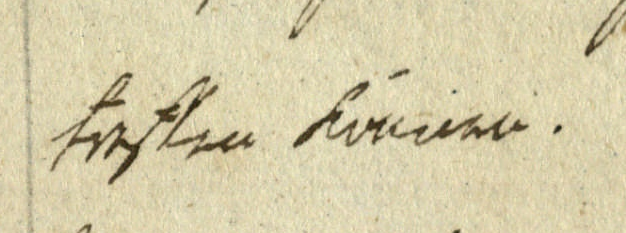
treffen können.
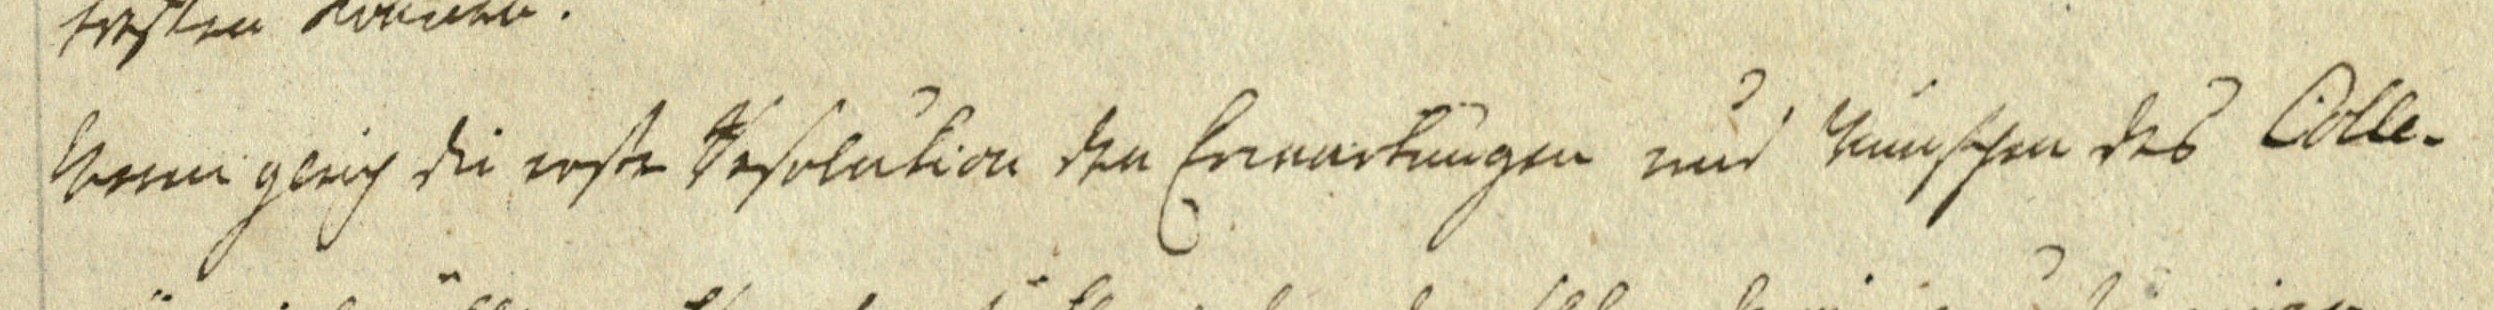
Wenn gleich die erste Resolution den Erwartungen und Wünschen des Colle¬
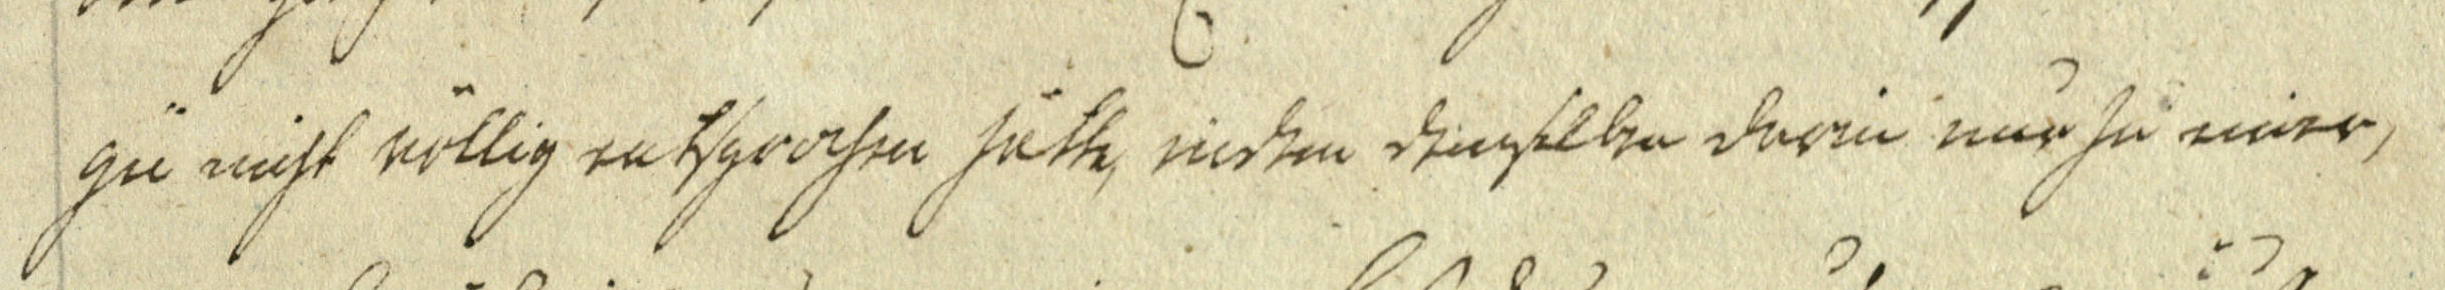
gii nicht völlig entsprochen hätte, indem demselben darin nur zu einer,
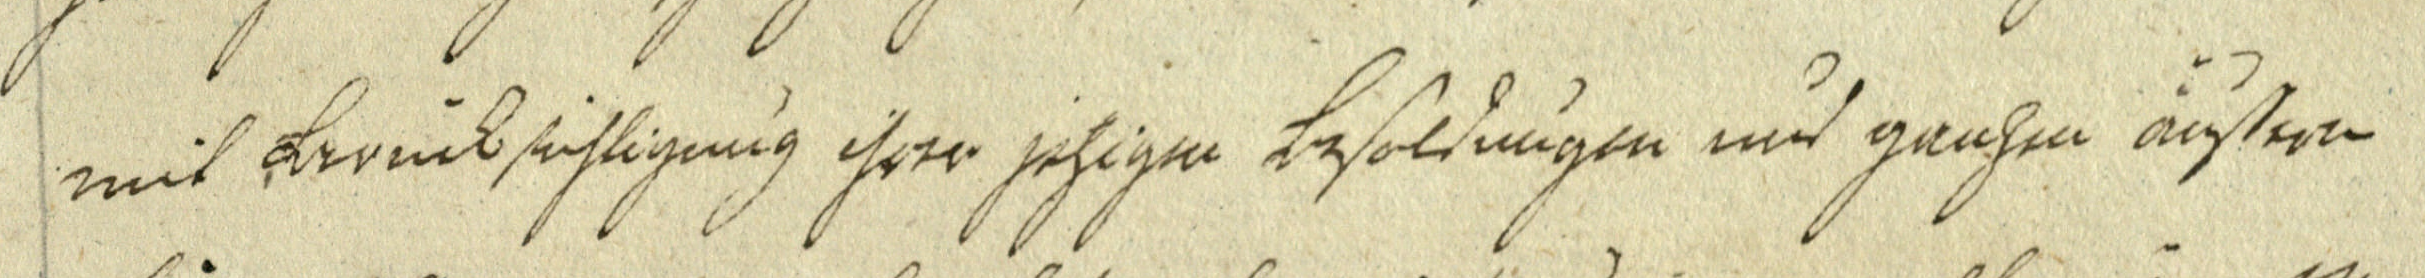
mit Berücksichtigung ihrer jetzigen Besoldungen und ganzen äusseren
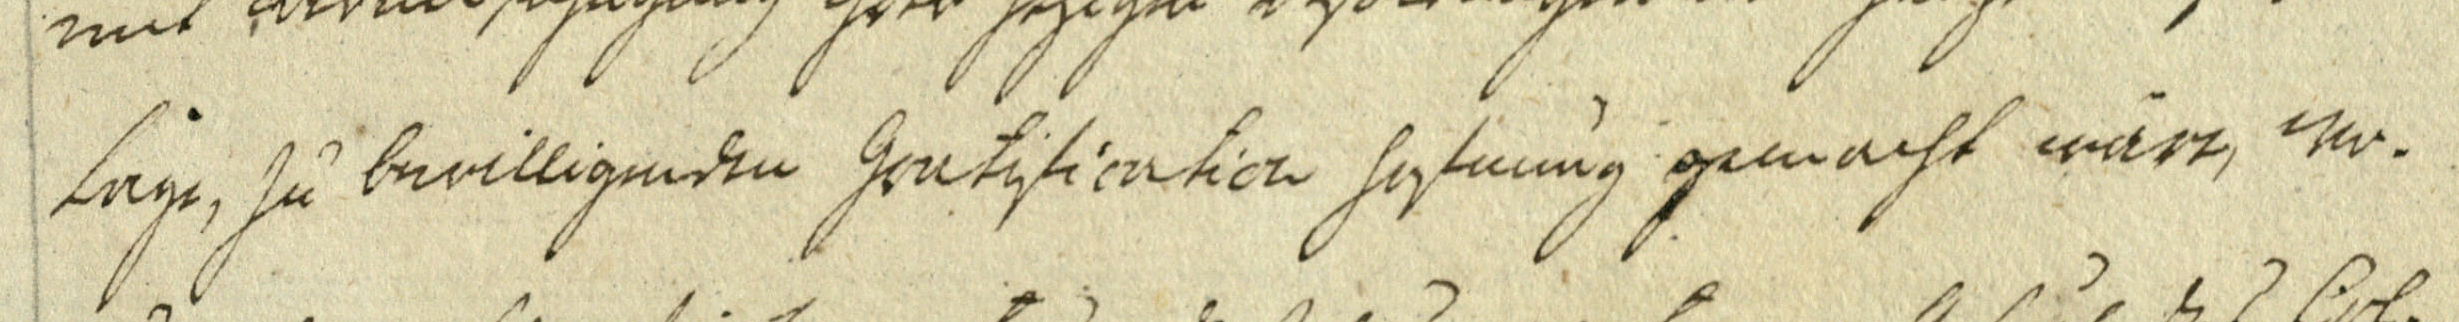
Lage, zu bewilligenden Gratification Hofnung gemacht wäre, wo¬
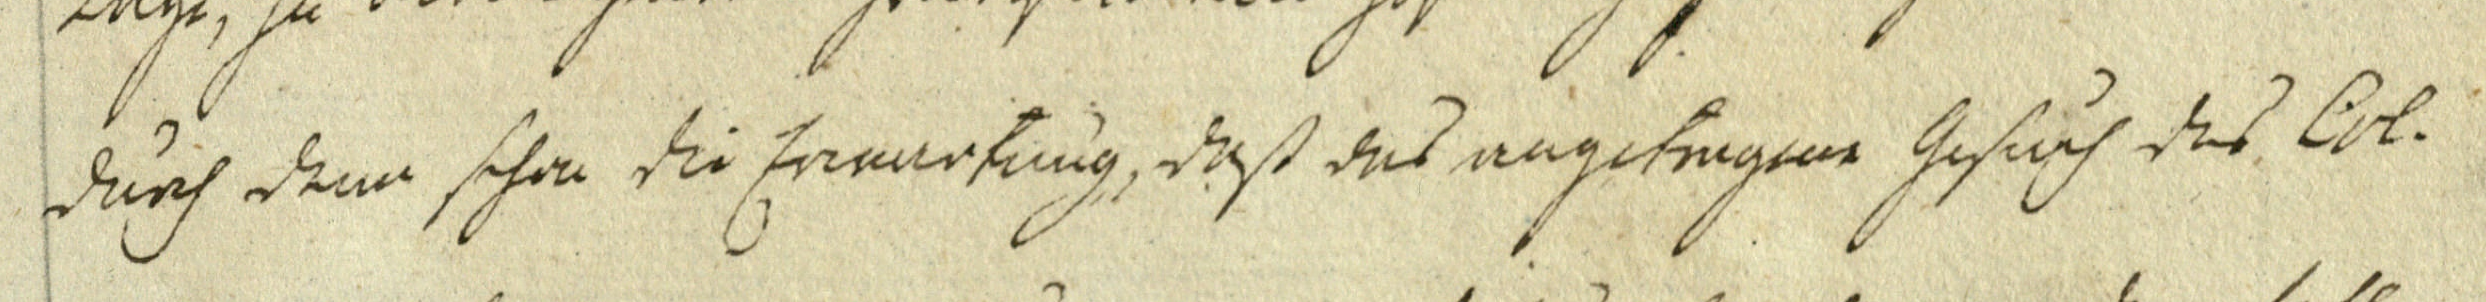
durch denn schon die Erwartung, daß das angetragene Gesuch des Col¬
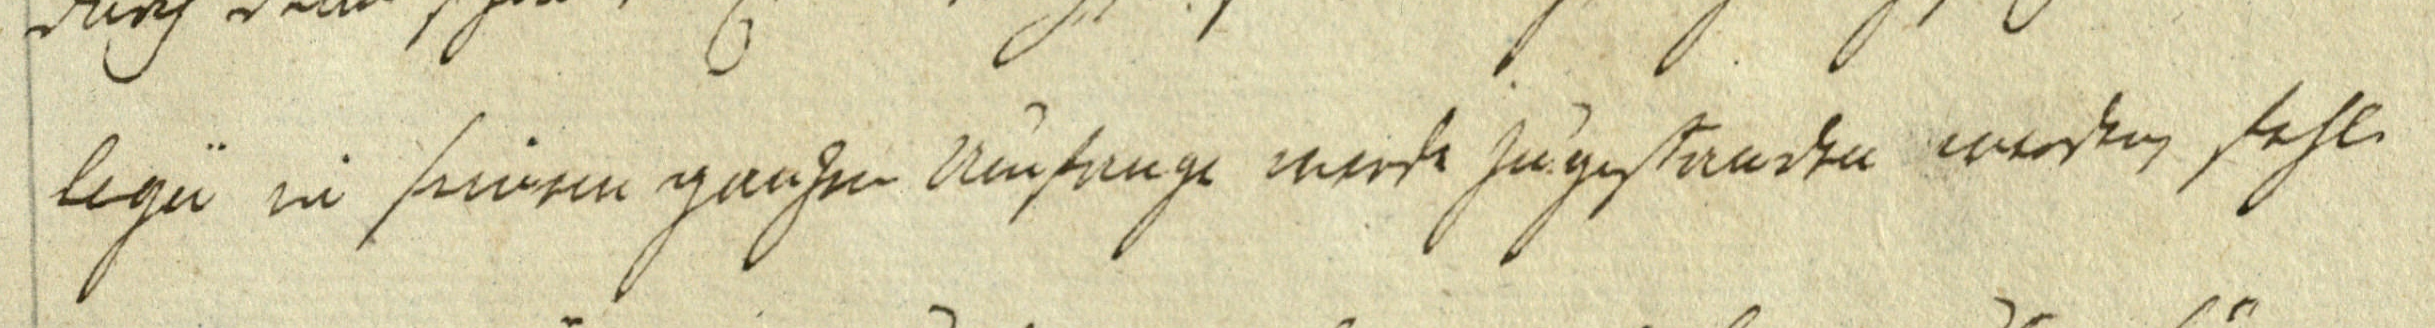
legii in seinem ganzen Anfange werde zugestanden werden, fehl¬
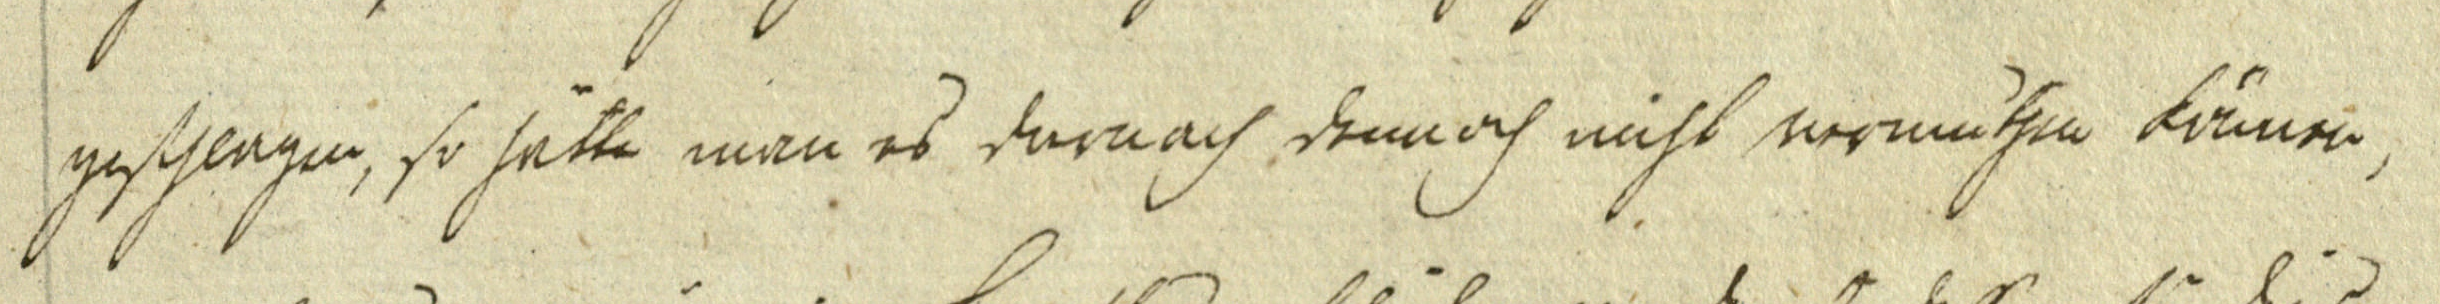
geschlagen, so hätte man es darnach dennoch nicht vermuthen können,
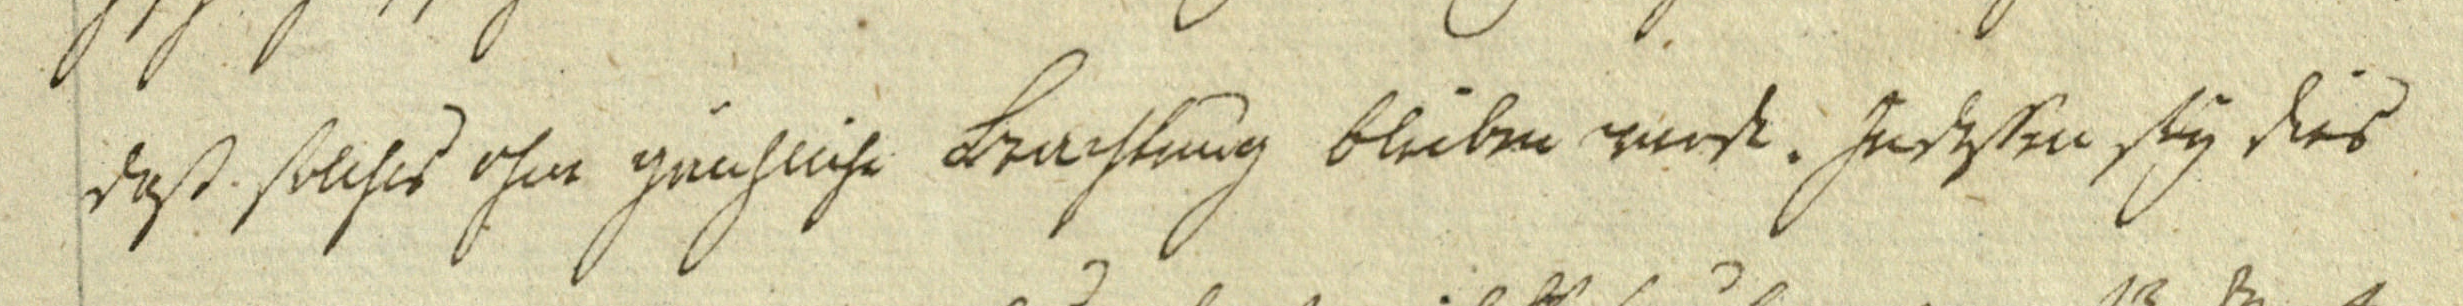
daß solches ohne gänzliche Beachtung bleiben würde. Indessen seÿ dies
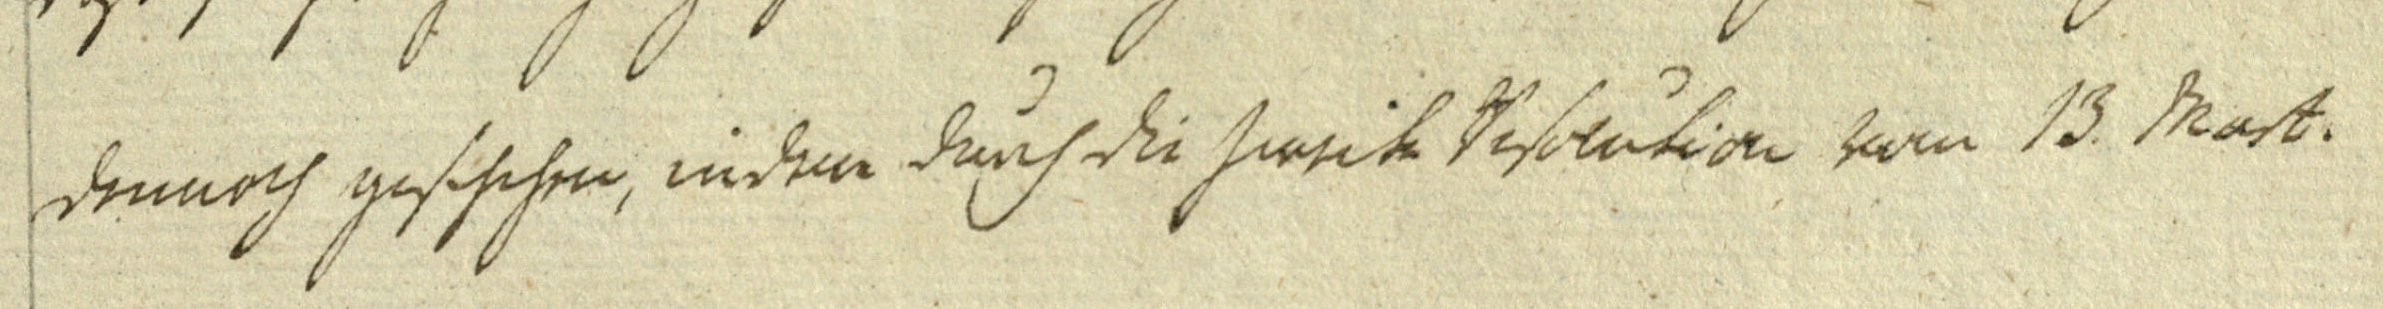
dennoch geschehen, indem durch die zweite Resolution vom 13 Mart.
